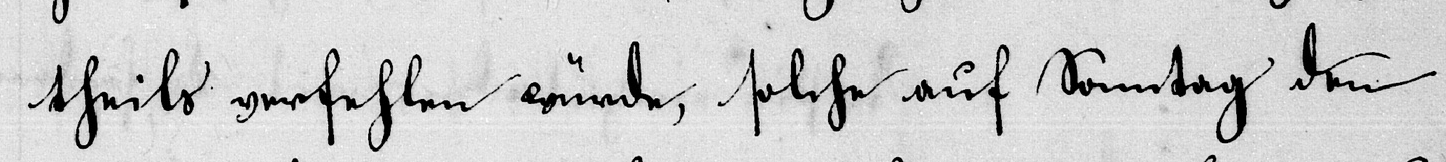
theils verfehlen würde, solche auf Sonntag den
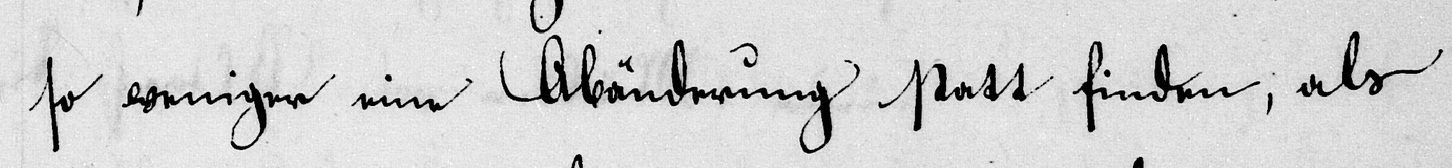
so weniger eine Abänderung statt finden, als
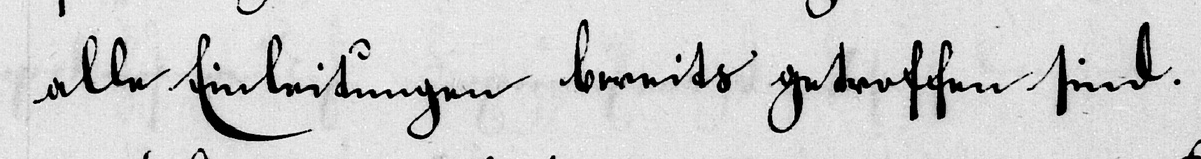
alle Einleitungen bereits getroffen sind.
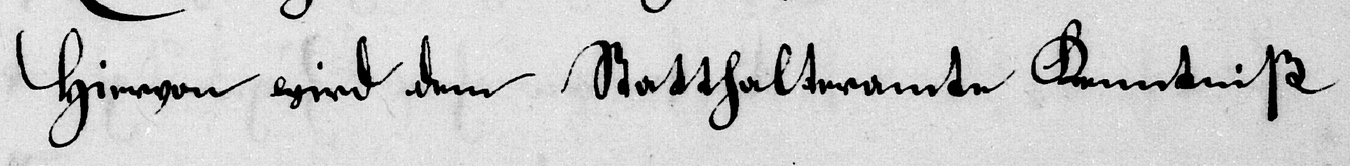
Hiervon wird dem Statthalteramte Kenntniß
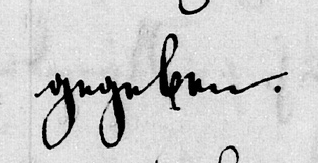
gegeben.
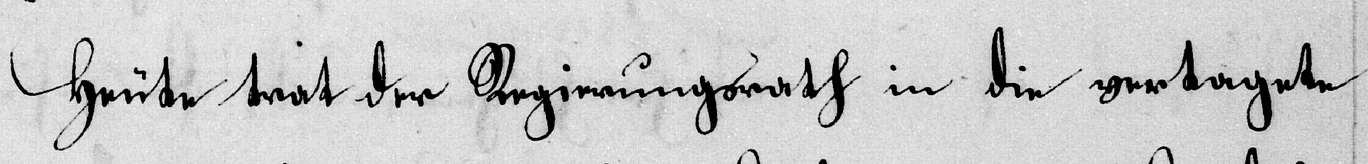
Heute trat der Regierungsrath in die vertagete
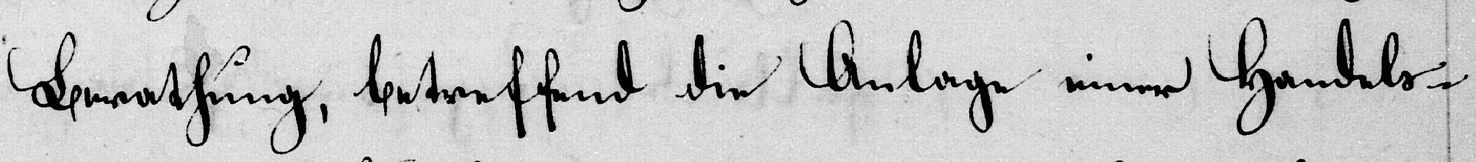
Berathung, betreffend die Anlage einer Handels¬
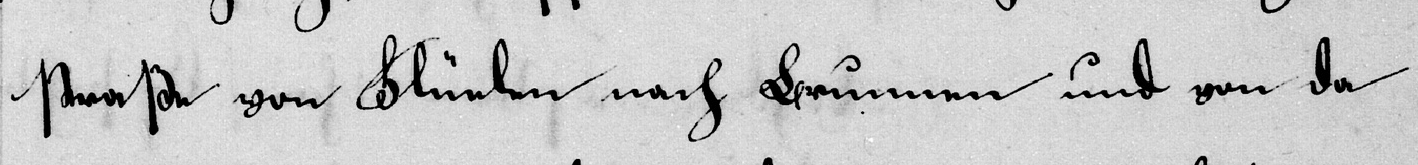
straße von Flüelen nach Brunnen und von da
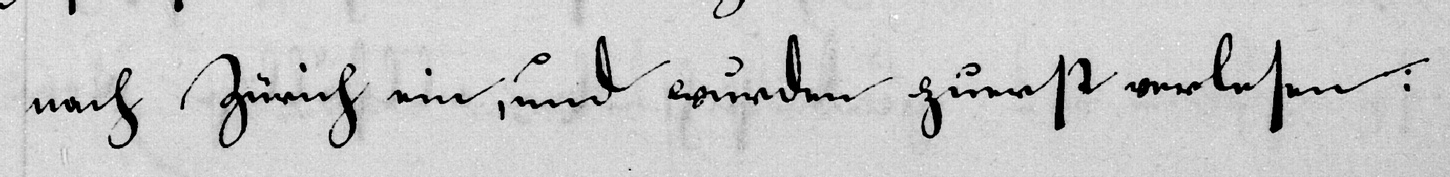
nach Zürich ein, und wurden zuerst verlesen:
